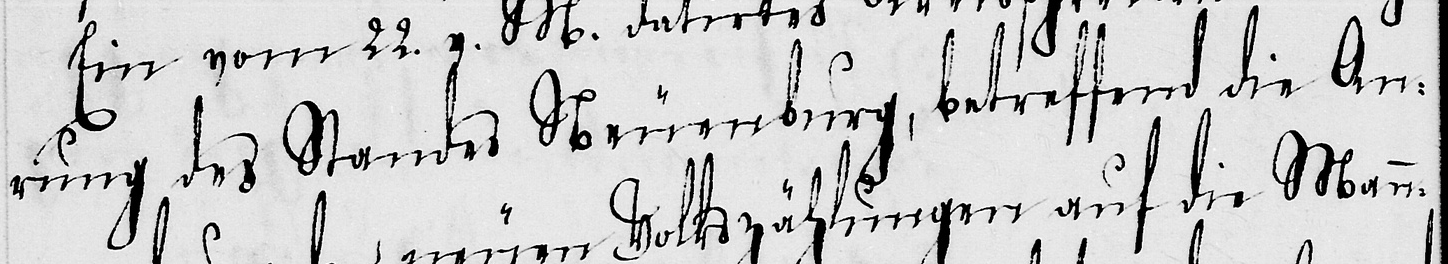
rung des Standes Neuenburg, betreffend die An¬
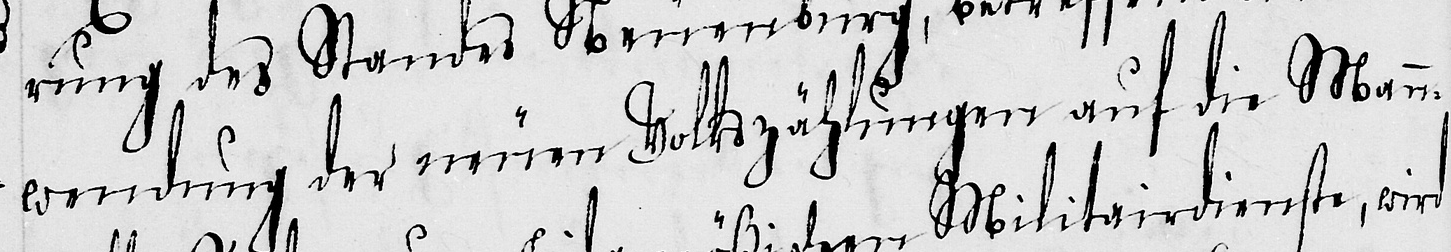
wendung der neuen Volkszählung auf die Man¬
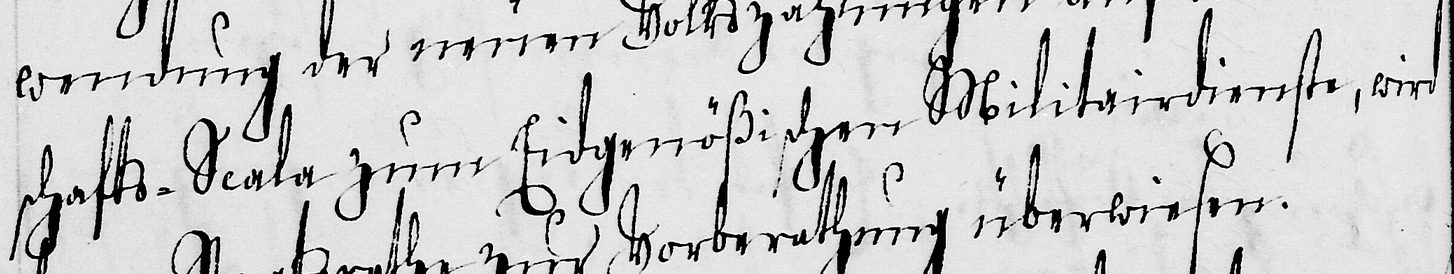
chafts-Scala zum Eidgenößischen Militairdienste, wi¬
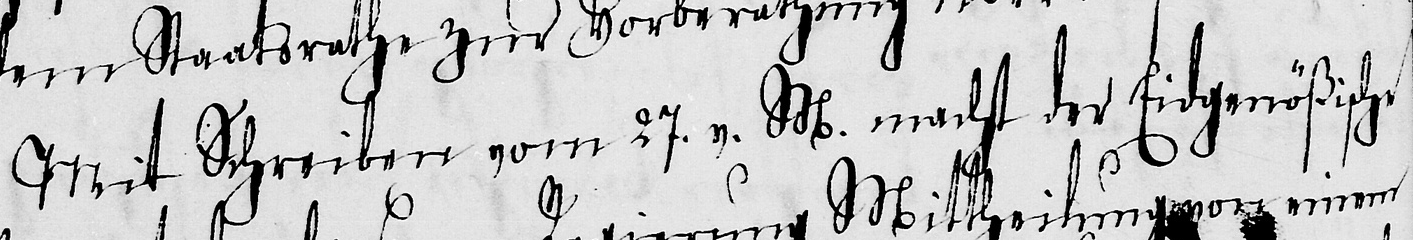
Mit Schreiben vom 27. v. M. macht der Eidgenößische
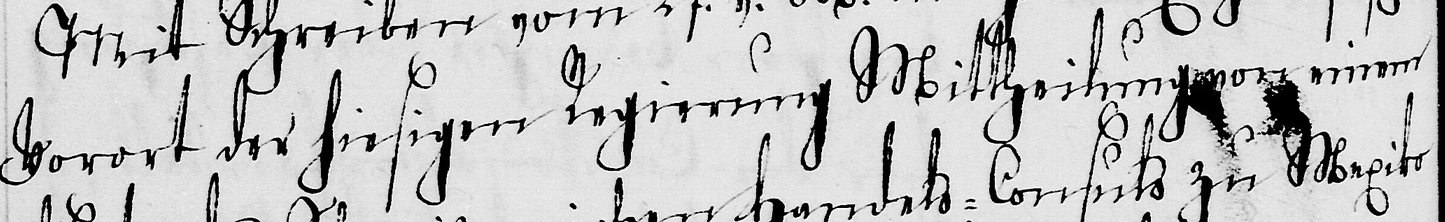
Vorort der hiesigen Regierung Mittheilung von einem
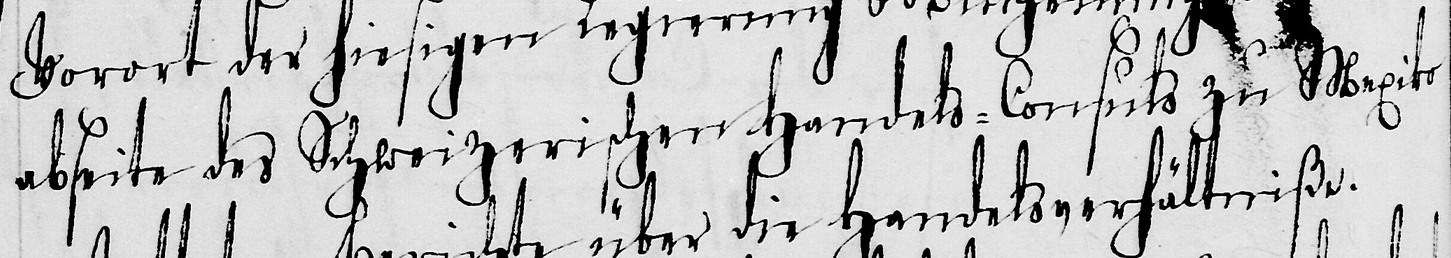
abseite des Schweizerischen Handels-Consuls zu Mexiko
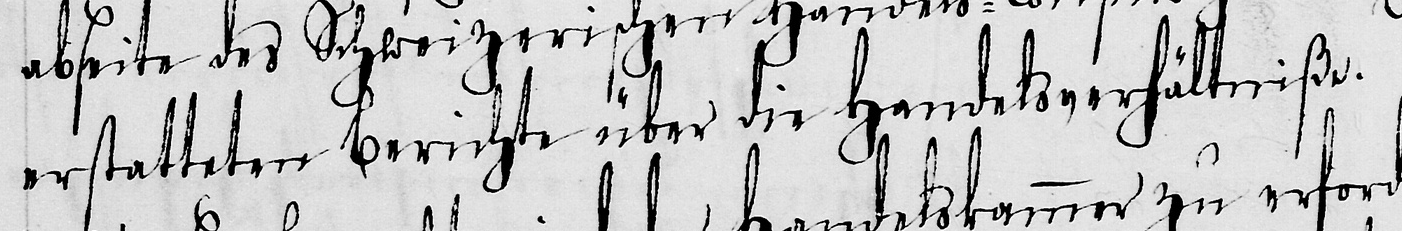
erstatteten Berichte über die Handelsverhältniße.
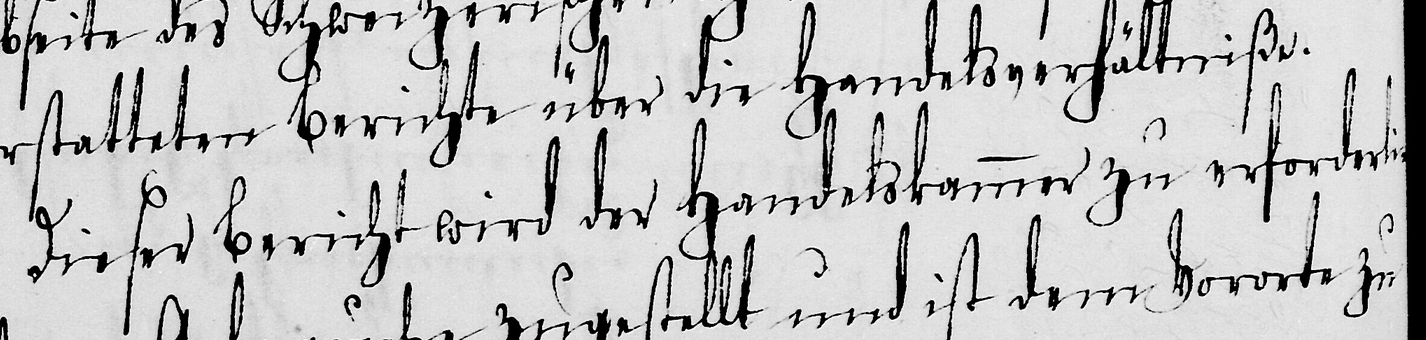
Dieser Bericht wird der Handelskammer zu erforderl¬
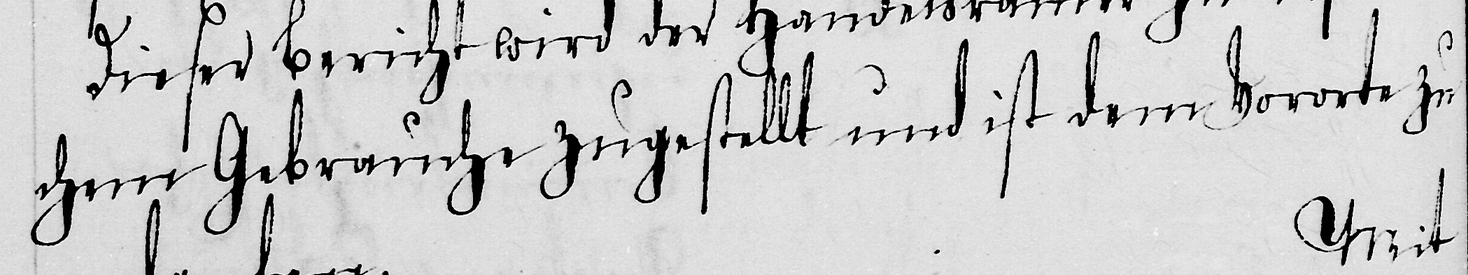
ichem Gebrauche zugestellt und ist dem Vororte zu
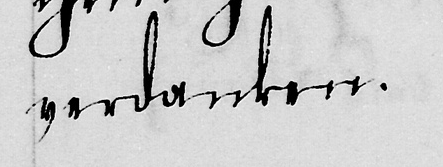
verdanken.
